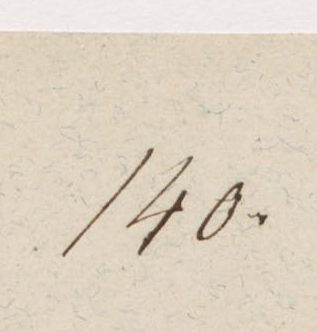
140.
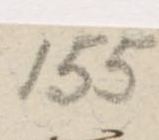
155
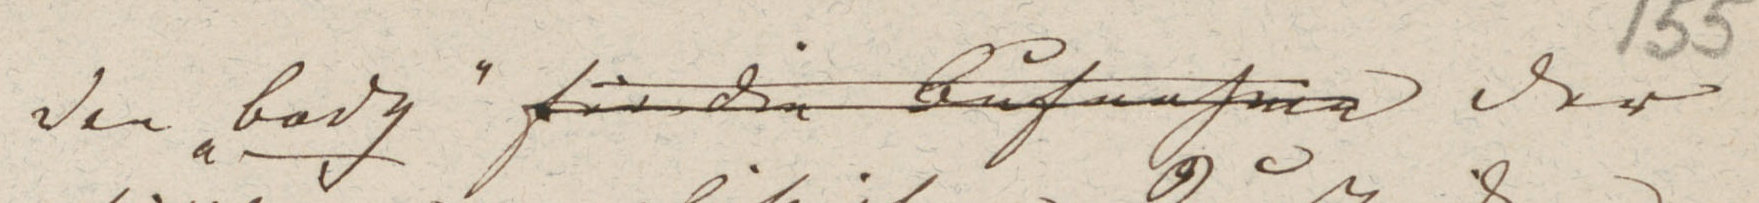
den "body" für die Aufnahme der
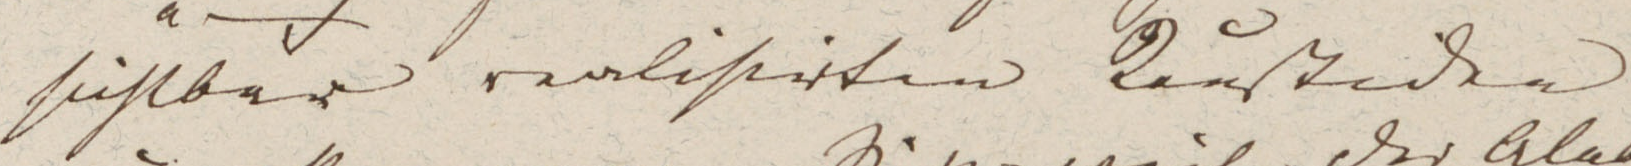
sichtbar realisirten Kunstidee
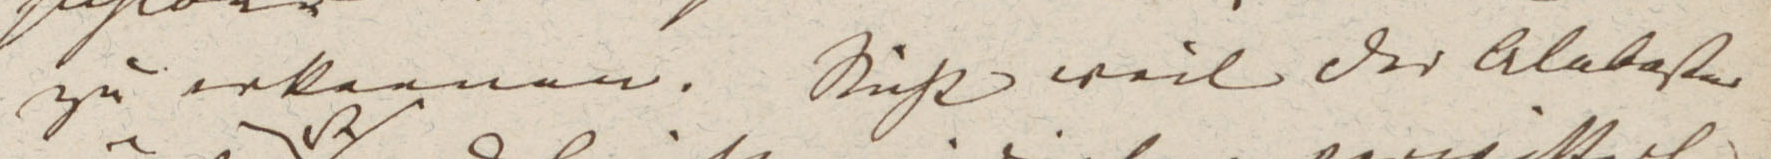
zu erkennen. Nicht weil der Alabaster
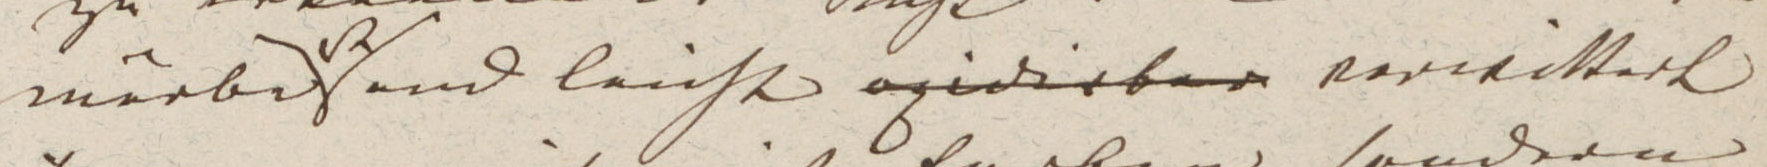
mürbe ist und leicht oxidirbar verwittert
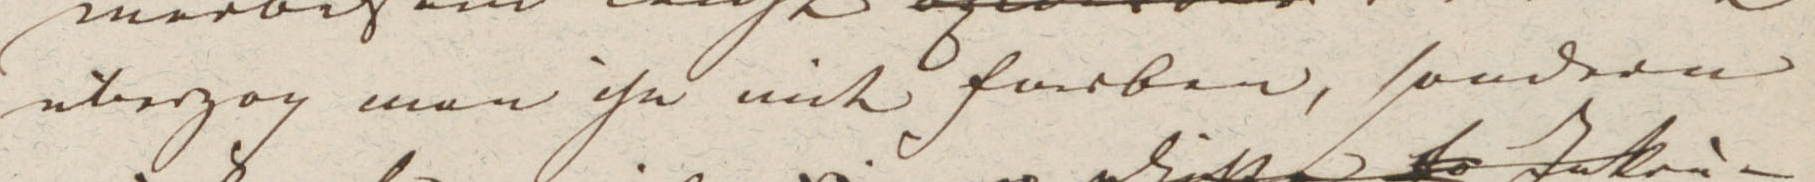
überzog man ihn mit Farben, sondern
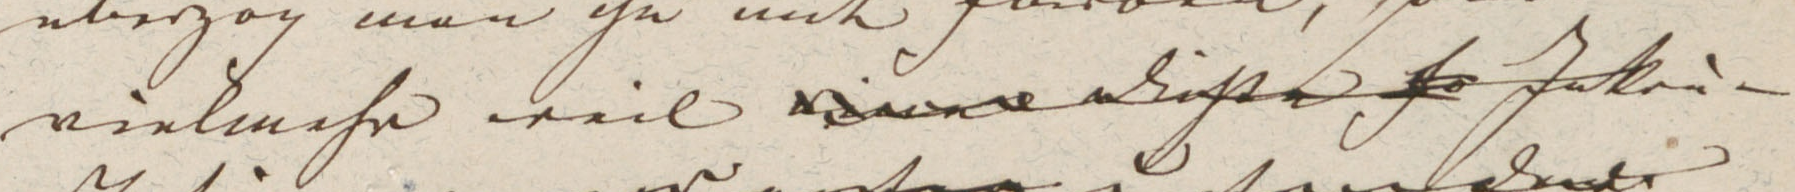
vielmehr weil eine dichte Fo Inkru-
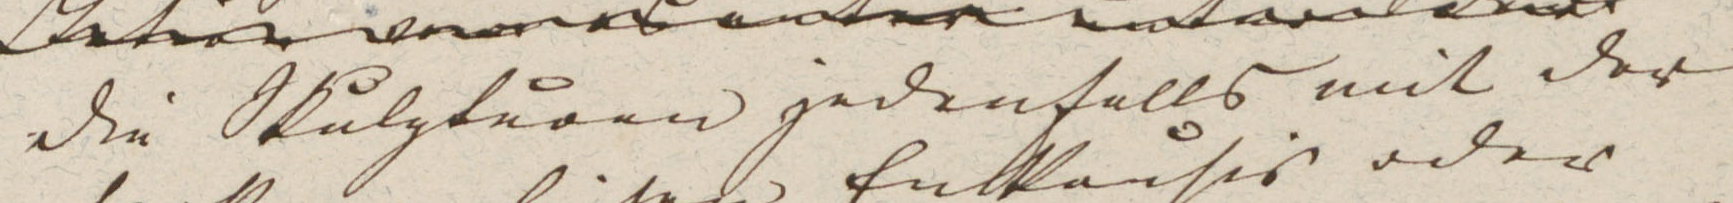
die Skulpturen jedenfalls mit der
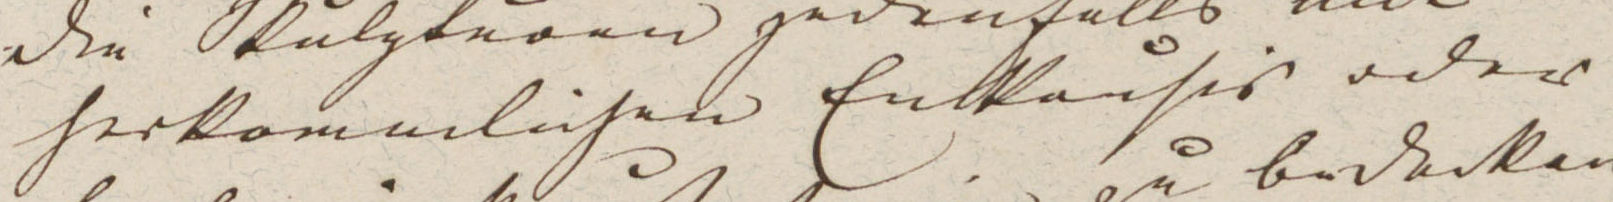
herkommlichen Enkausis oder
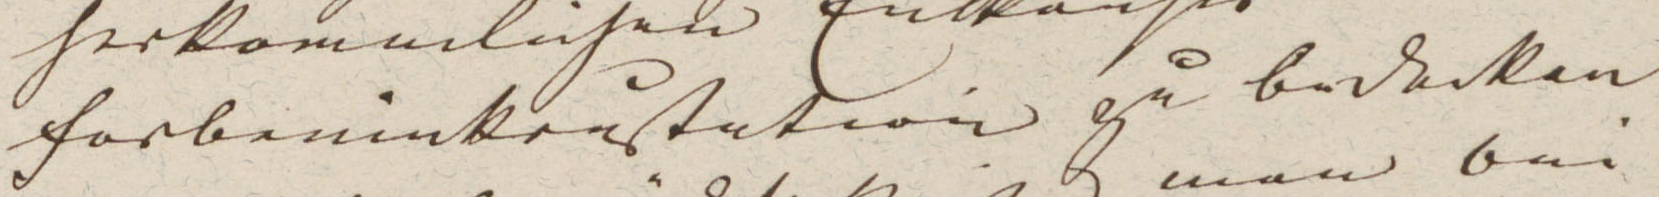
Farbeninkrustation zu bedecken
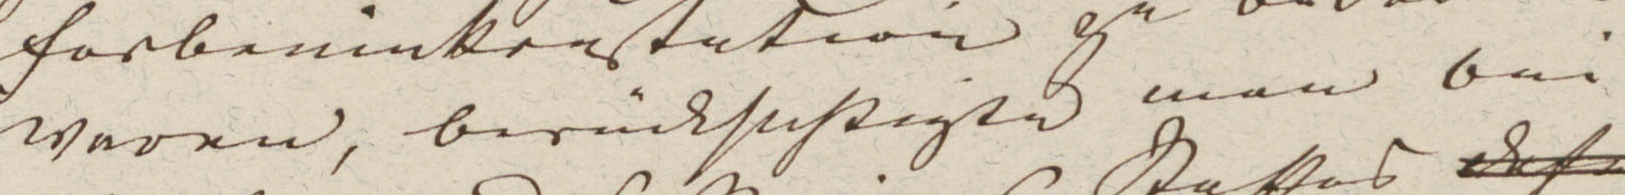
waren, berücksichtigte man bei
